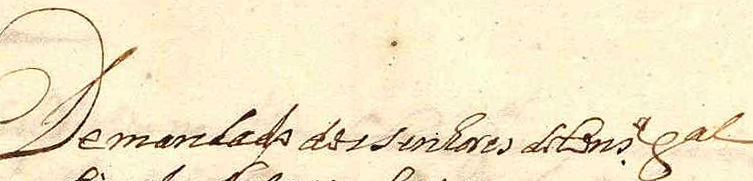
De mandado dos senhores de Cons.o Gal
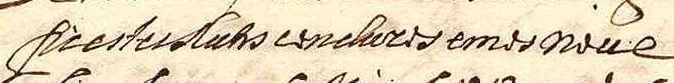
fis estes Autos concluzos em os noue
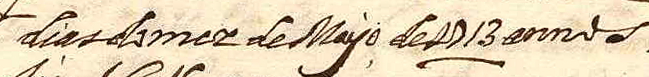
dias do mez de Mayo de 1713 annos
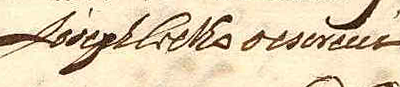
Joseph Coelho o escreui
